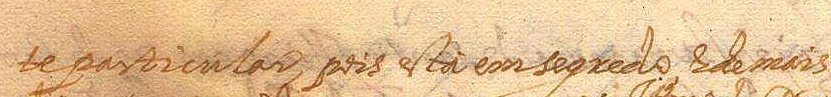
te particular, pois esta em segredo E de mais
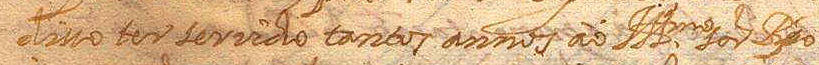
disso ter servido tantos annos ao Ill.mo sor̄ Bp̄o
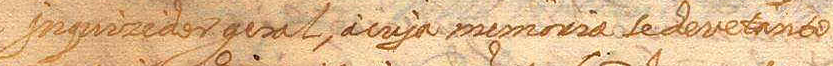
jnquizidor geral, a cuja memoria se deve tanto
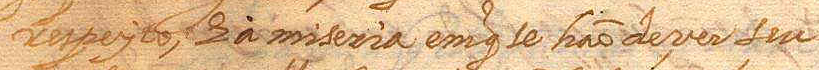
respeyto, E a miseria em q̄ se haõ de ver seu
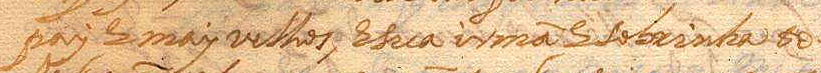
pay e may velhos, E sua irmā, E sobrinha to
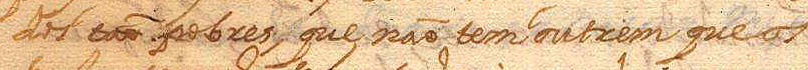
dos taõ pobres, que naõ tem outrem que os
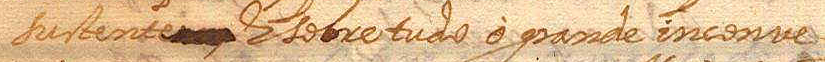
sustente _ E sobretudo o grande inconve
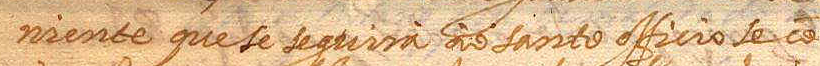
niente que se seguira no santo officio se cō
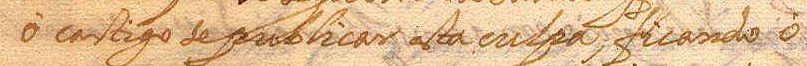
o castigo se publicar esta culpa, ficando o
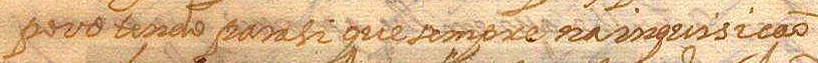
povo tendo para si que sempre na inquisiçaõ
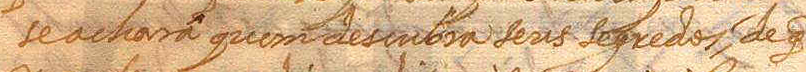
se achará quem descubra seus segredos, de q̄
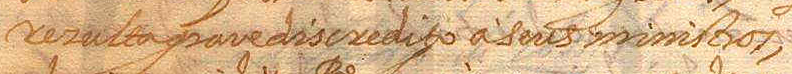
rezulta para discredito a seus ministros,
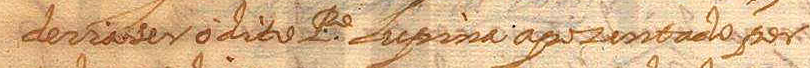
devia ser o dito P.o Lupina apozentado por
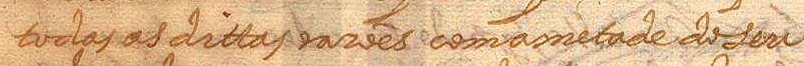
todas as dittas razoẽs com a metade do seu
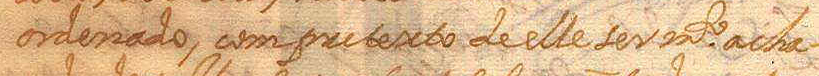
ordenado, com pretexto de elle ser mt.o acha
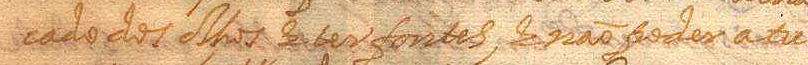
cado dos olhos E ter fontes, E naõ poder atu
